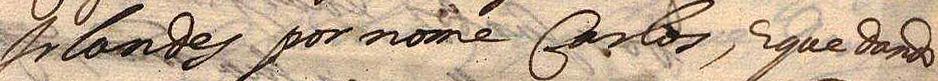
Jrlandes por nome Carlos, E que dando
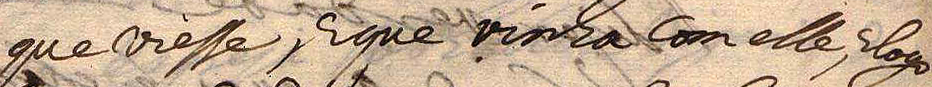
que viesse, E que vinha com elle, E logo
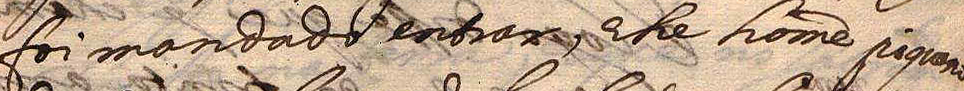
foi mandado entrar, E he hom̄e piqueno
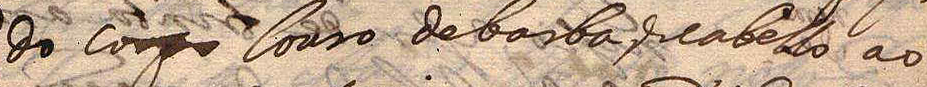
do corpo louro de barba, E cabello ao
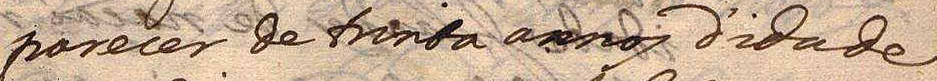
parecer de trinta annos d’idade
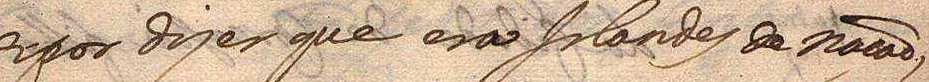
E por dizer que era Jrlandes de nação,
